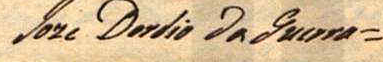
Ioze Dordio da Guerra =
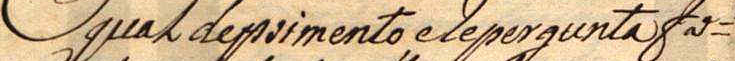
O qual depoimento, e Repergunta fo
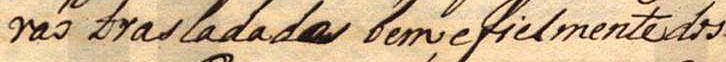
raõ trasladados, bem e fielmente dos
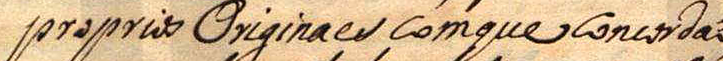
proprios Originaes com que concordaõ,
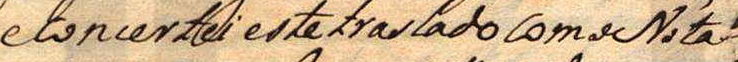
e concertei este traslado Com o Nota
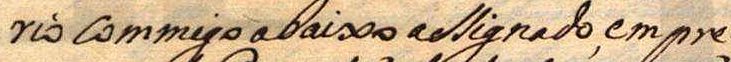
rio Commigo abaixo assignado, em pre
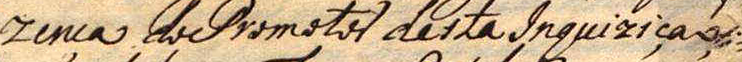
zença do Promotor desta Inquiziçaõ
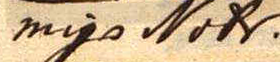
migo Notr.o
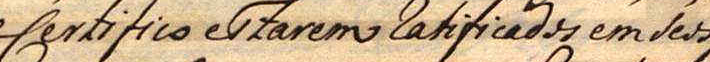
e Certifico estarem Ratificados em seos
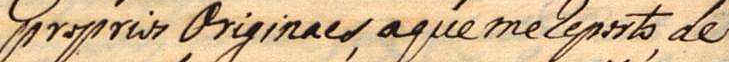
proprios Originaes, a que me Reporto, de
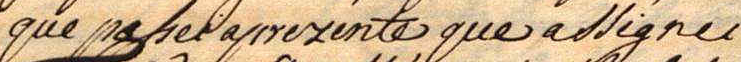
que passei a prezente que assignei
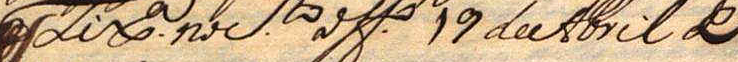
Lix.a no S.to off.o 19 de Abril d̄
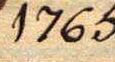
1765
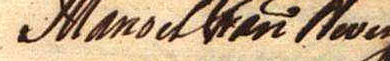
Manoel Fran.co Neves
